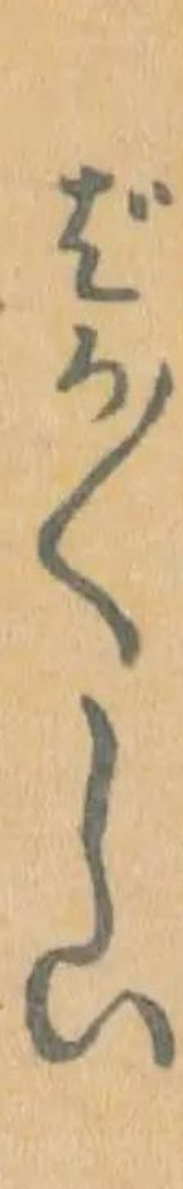ばか〳〵しい
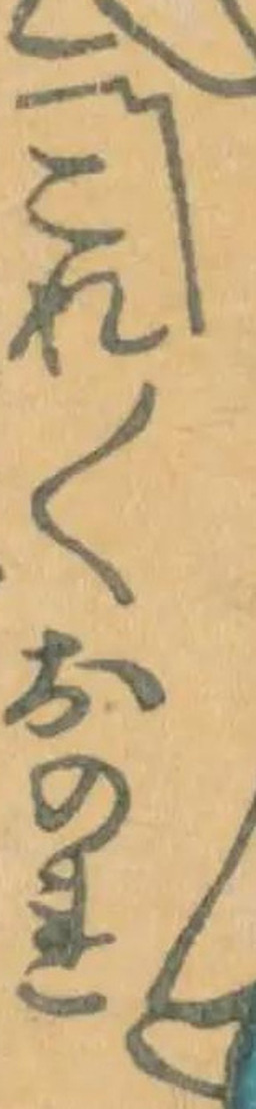〽これ〳〵おのれ
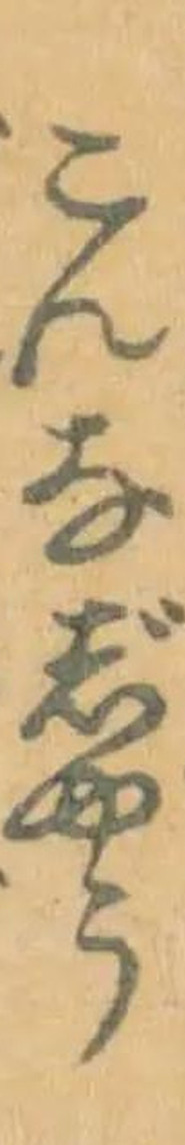こんなじやう
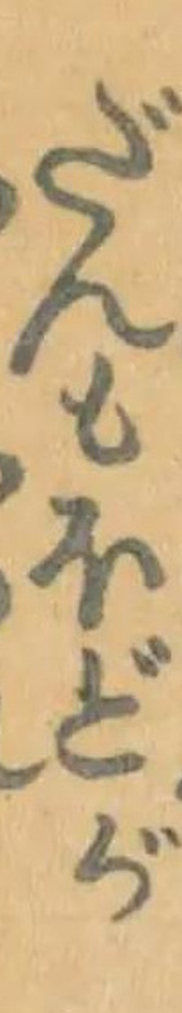だんもほどが
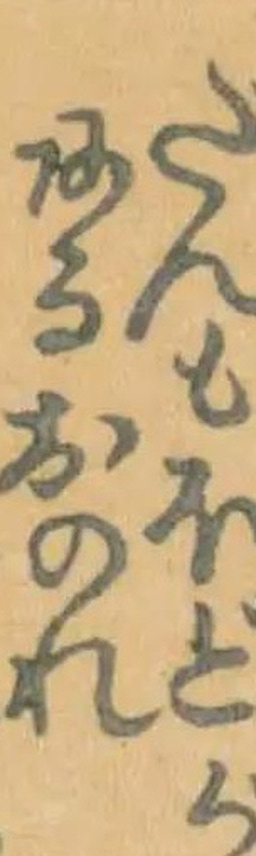あるおのれ

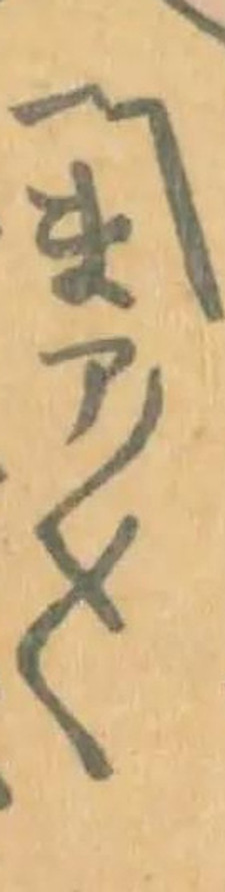〽まア〳〵〳〵
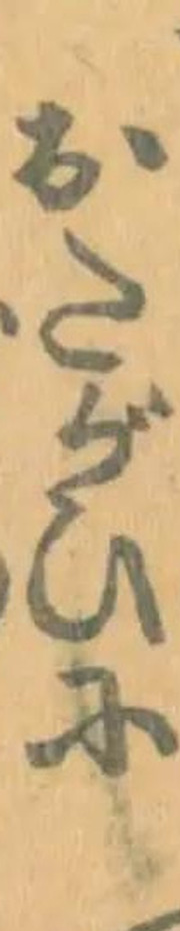おたがひに
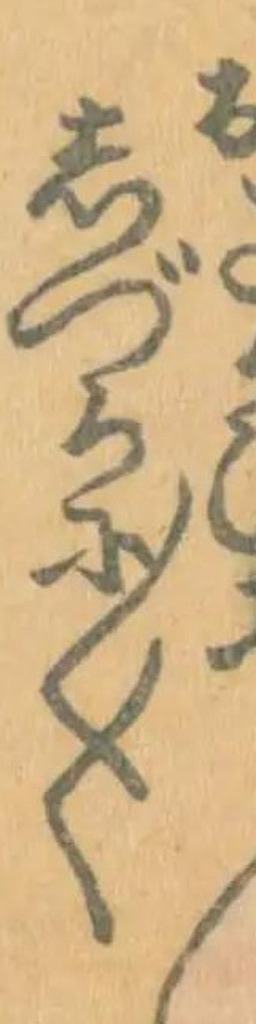しづかに〳〵〳〵
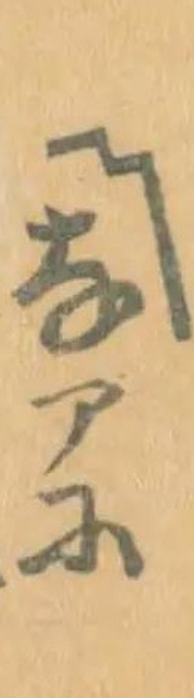〽なアに
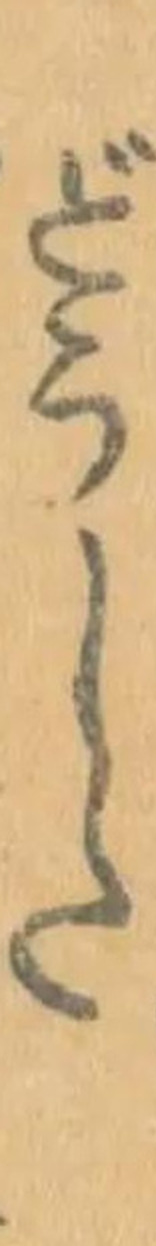どうした
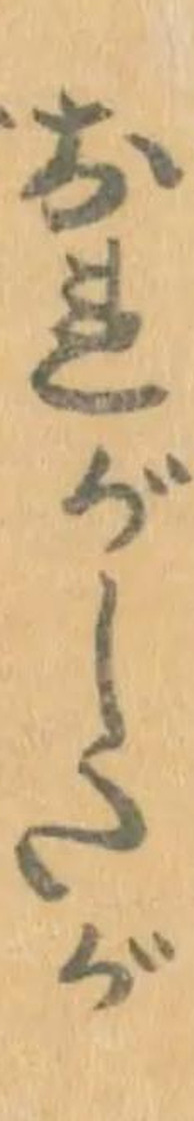おれがしたが
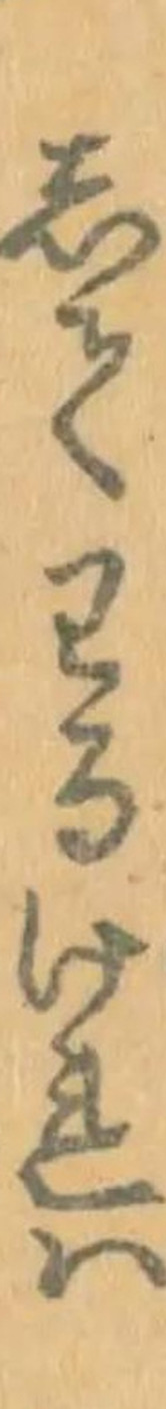してわるけれは
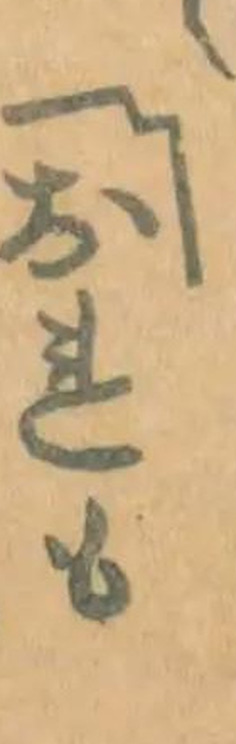〽おれも
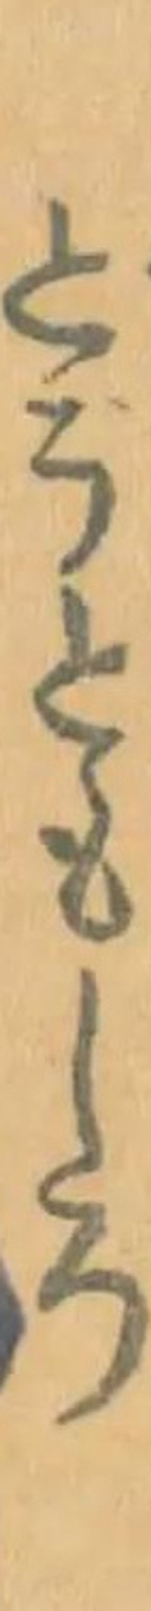とうともしろ
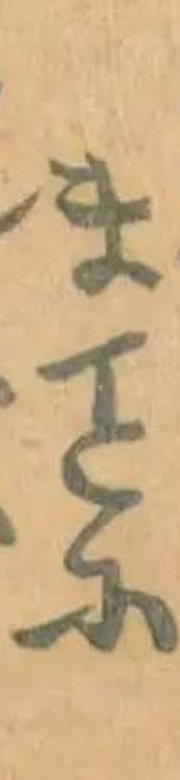まことに
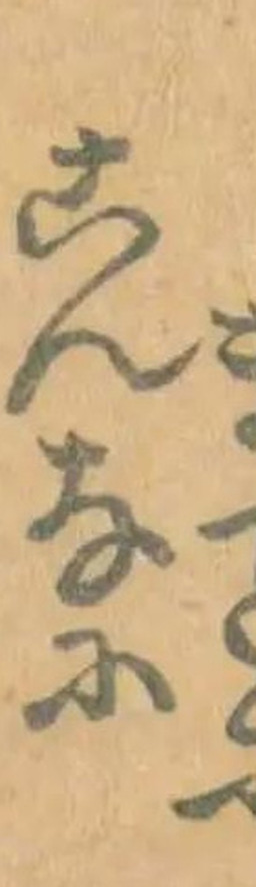こんなに
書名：国芳国貞錦絵
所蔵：国立国会図書館 National Diet Library, JAPAN
